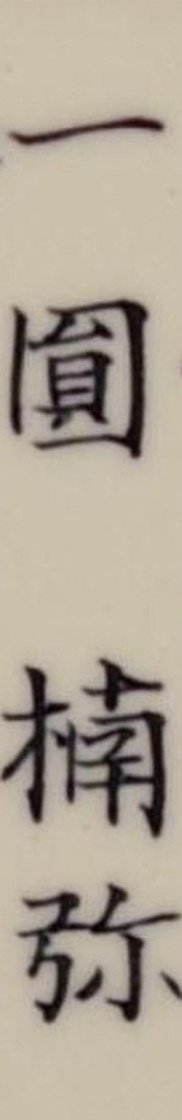一圓楠弥
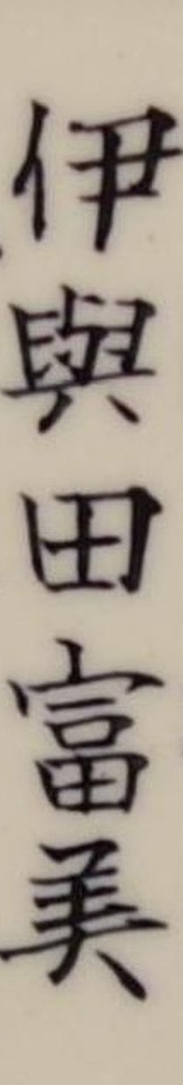伊與田富美
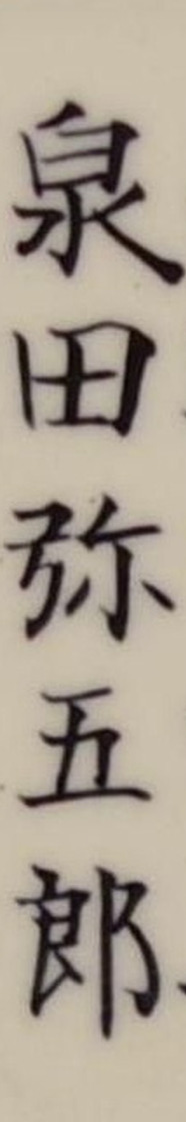泉田弥五郎
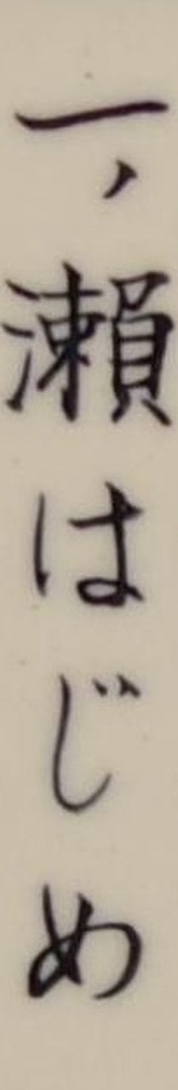一ノ瀬はじめ
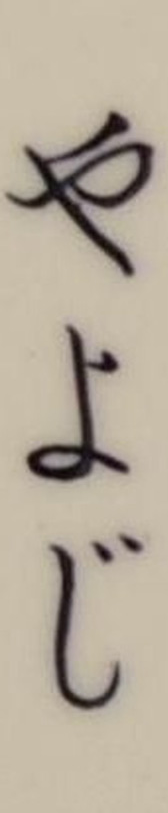やよじ
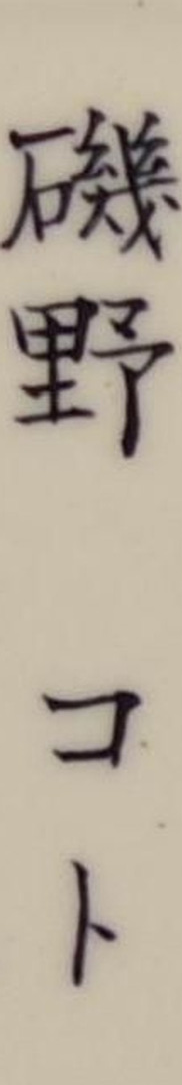磯野コト
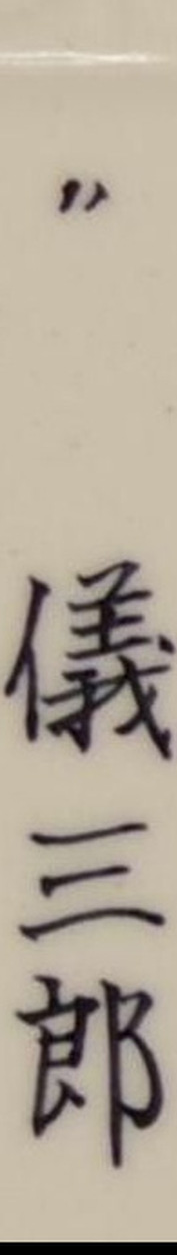儀三郎
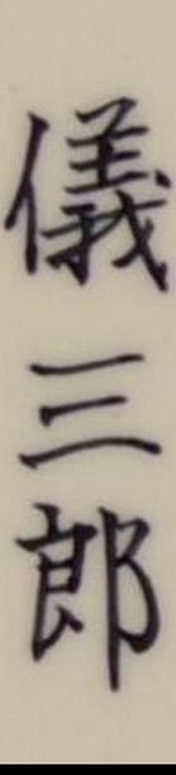儀三郎
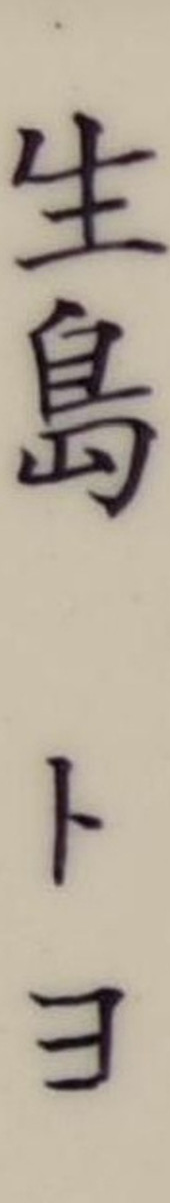生島トヨ
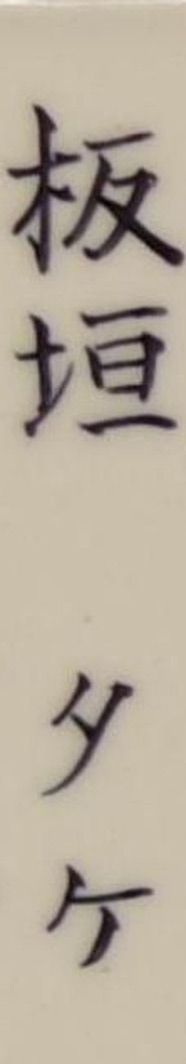板垣タケ

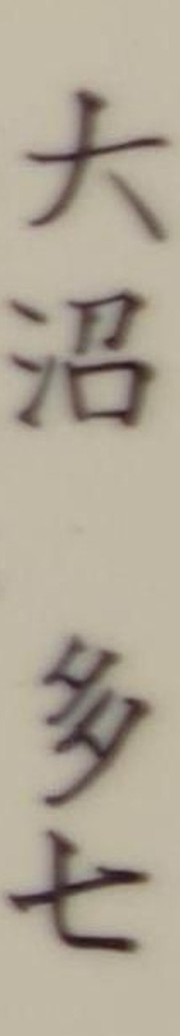大沼多七
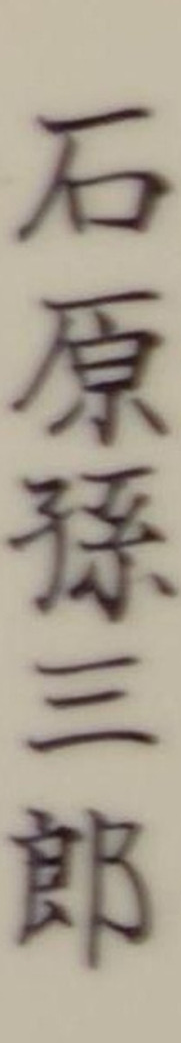石原孫三郎
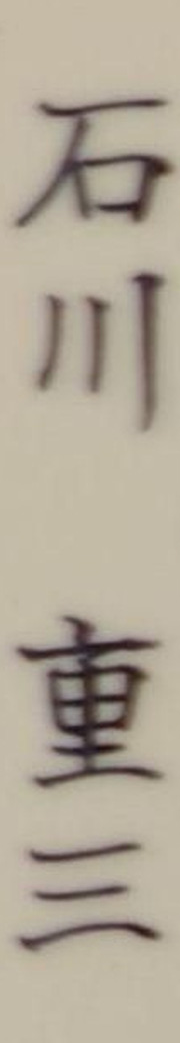石川重三
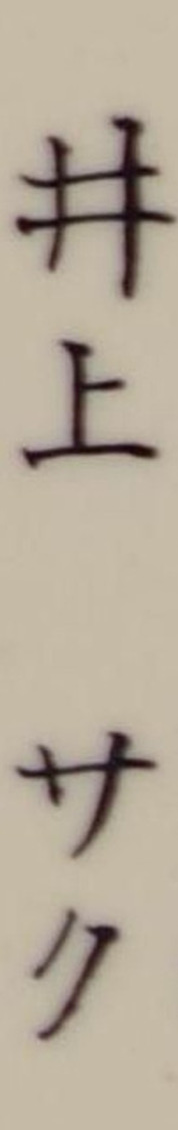井上サク
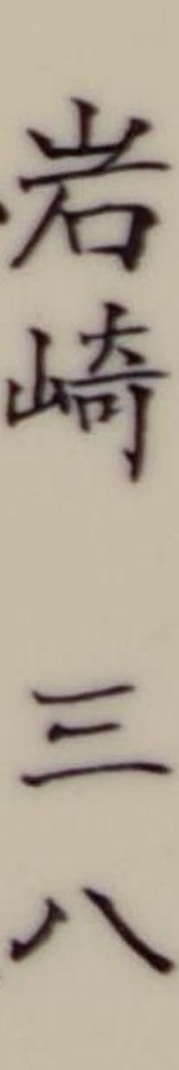岩崎三八
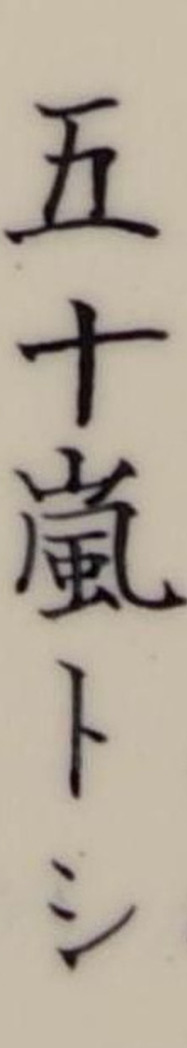五十嵐トシ
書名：M~S
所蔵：高野山金剛峯寺
